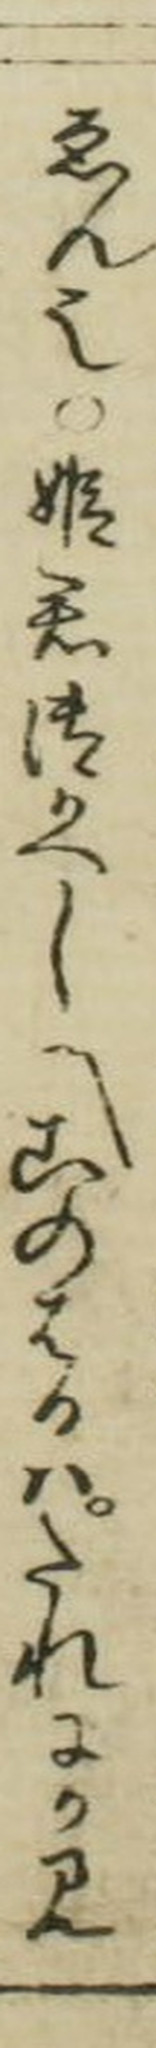ゑん也◯姫君御かへし〽このはかは。たれにか見
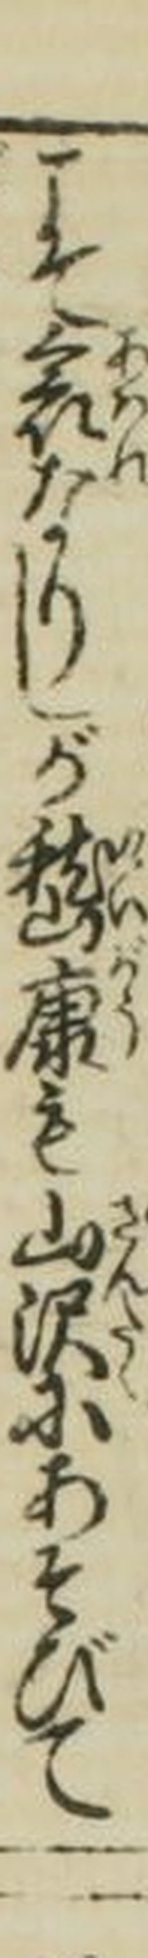こそ哀なりしが嵆康も山沢にあそびて
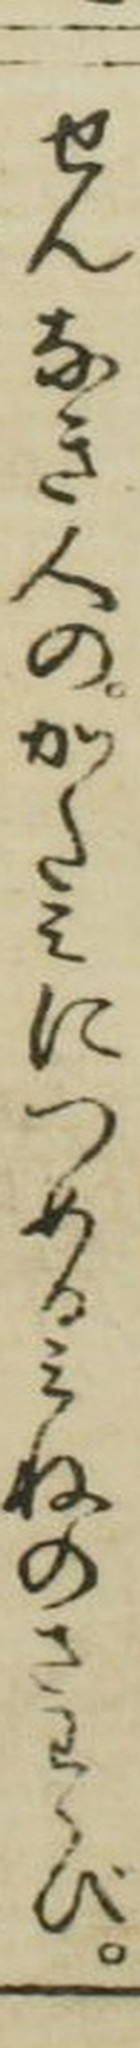せんなき人の。かたみにつめるみねのさわらび。
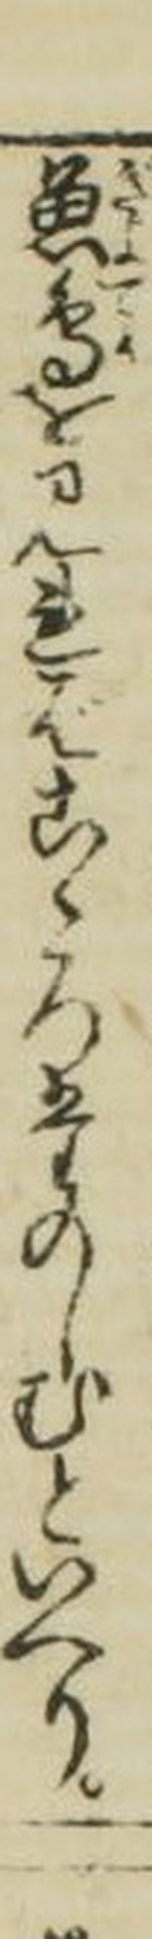魚鳥を見ればこゝろたのしむといへり。
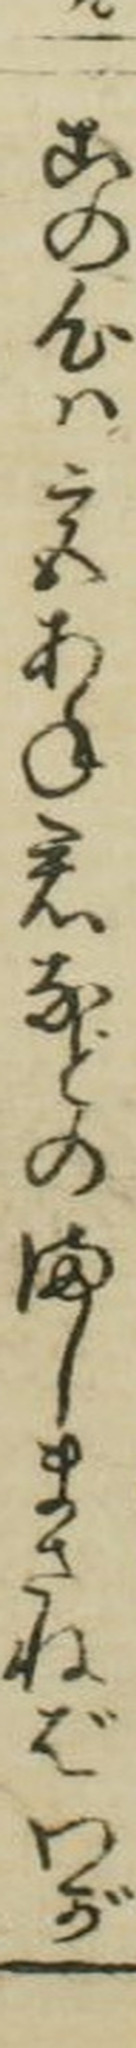この心は。宮あね君などのましまさねばわが
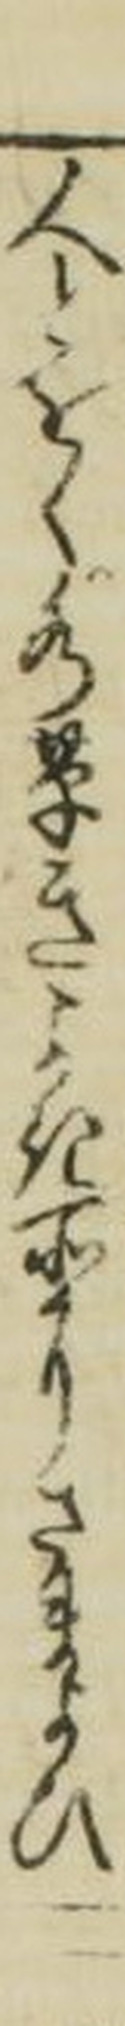人とをく。水草きよき所にさまよひ
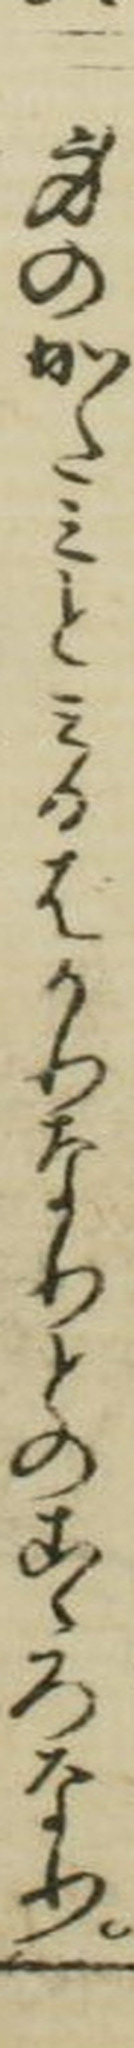身のかたみとみるばかりなりとのこゝろなり。
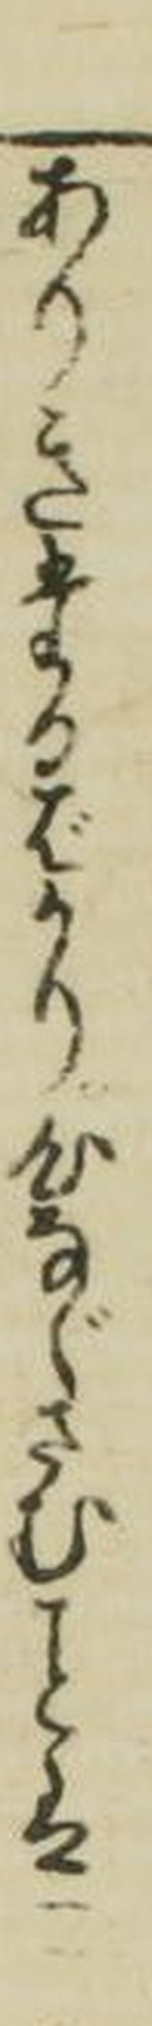ありきたるばかり。心なぐさむことは
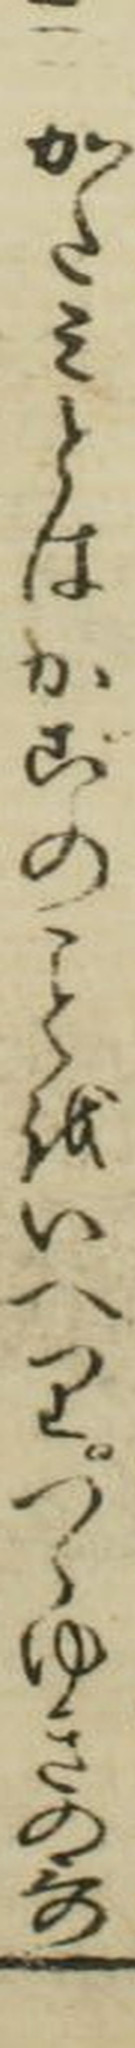かたみとはかごのことをいへり。つらゆきの哥
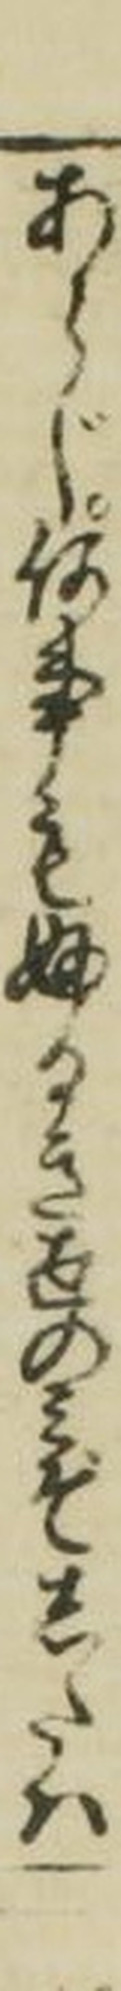あらじ。何事もふるき世のみぞしたは
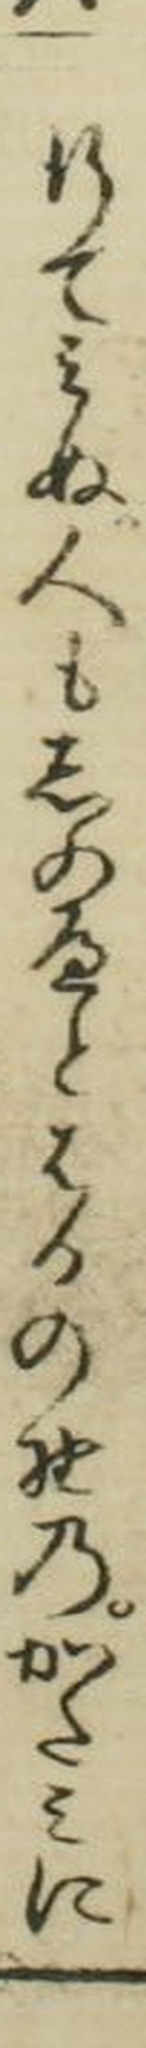行てみぬ。人もしのへとはるの野の。かたみに
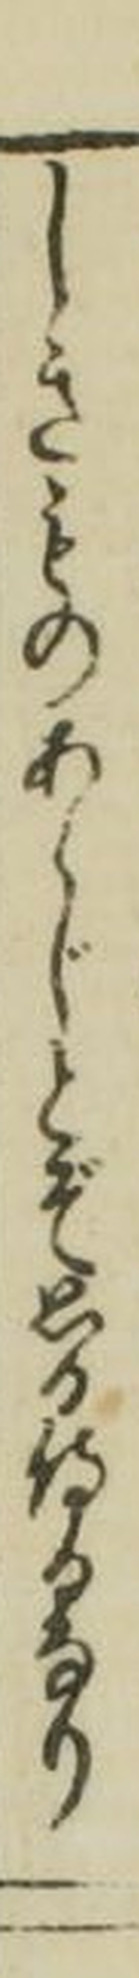しきものあらじとぞ思ひ侍るなり
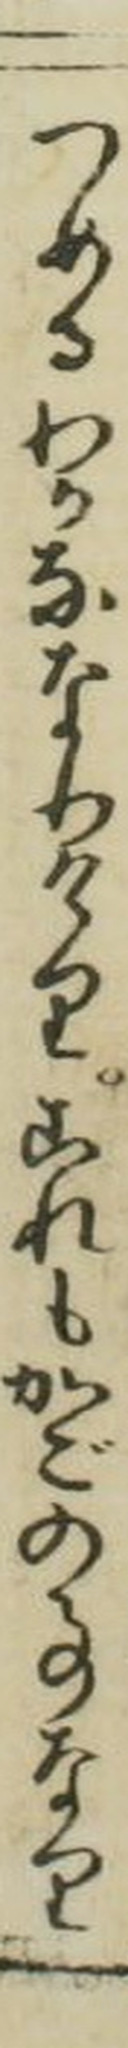つめるわかななりけり。これもかごの事なり
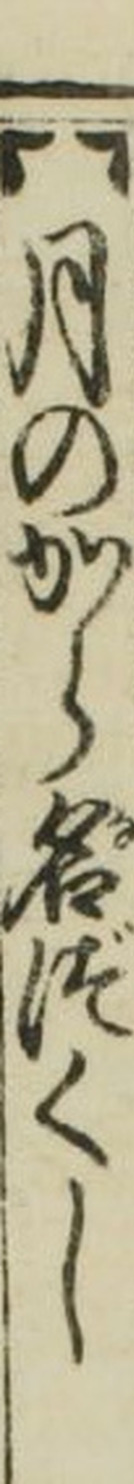月のから名づくし
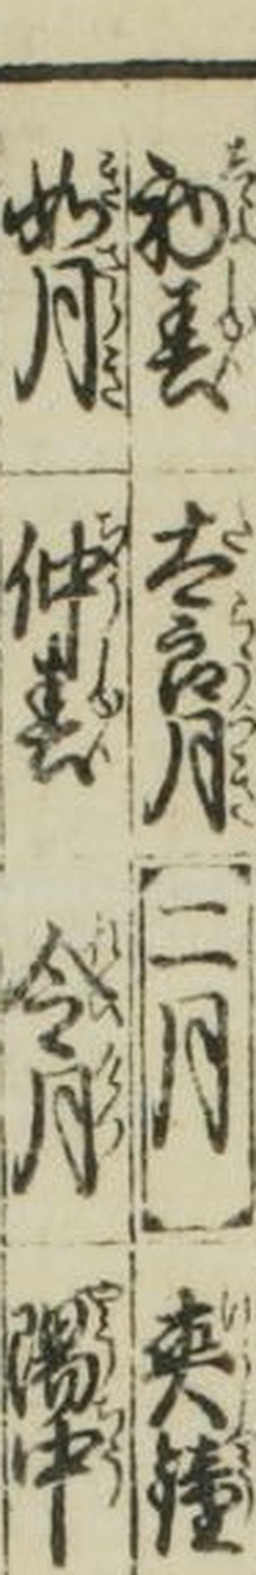如月仲春令月陽中
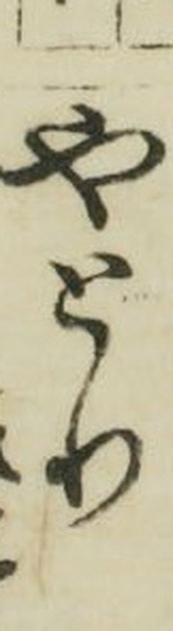やどり
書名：女源氏教訓鑑
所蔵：東京学芸大学附属図書館
